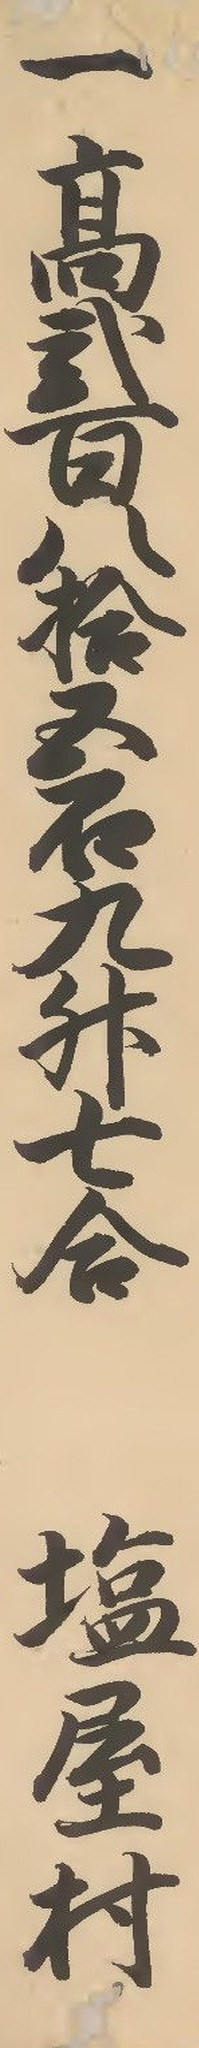一髙弐百八拾五石九升七合塩屋村
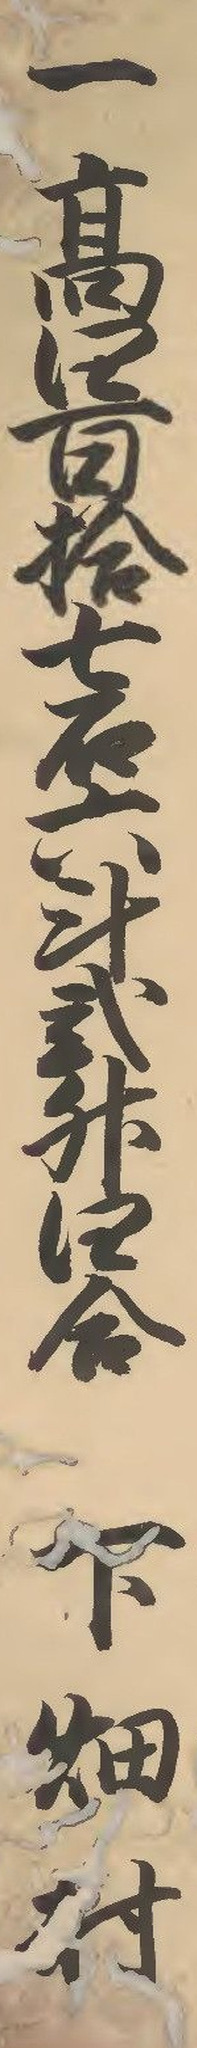一髙四百拾七石六斗弐升四合下畑村

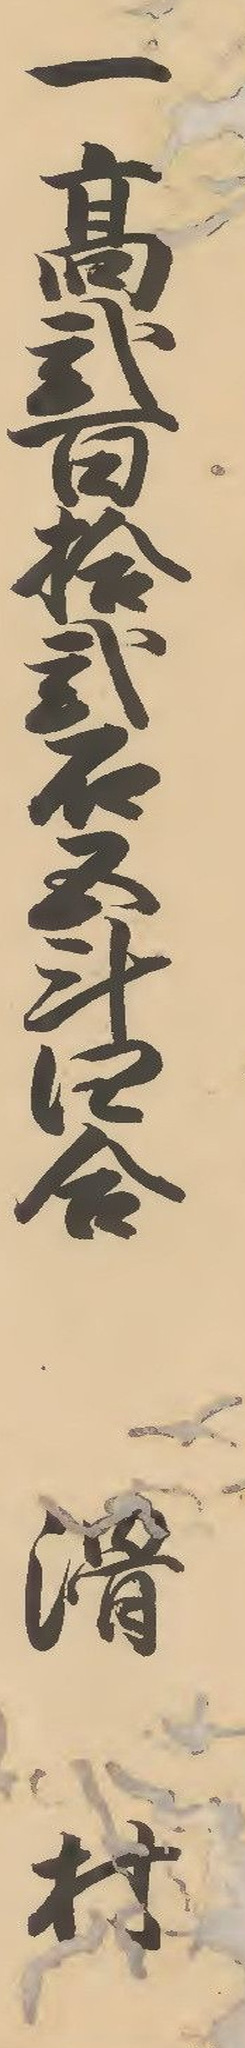一髙弐百拾弐石五斗四合滑村
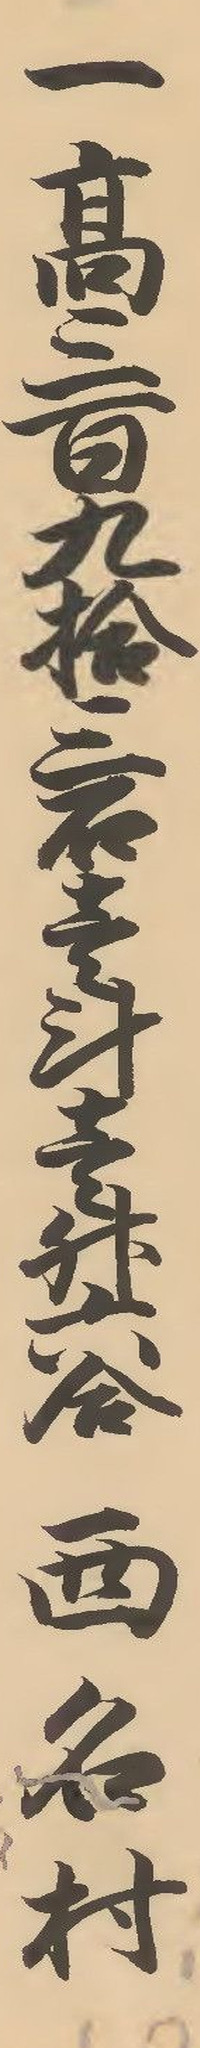一髙三百九拾三石壱斗壱升六合西名村
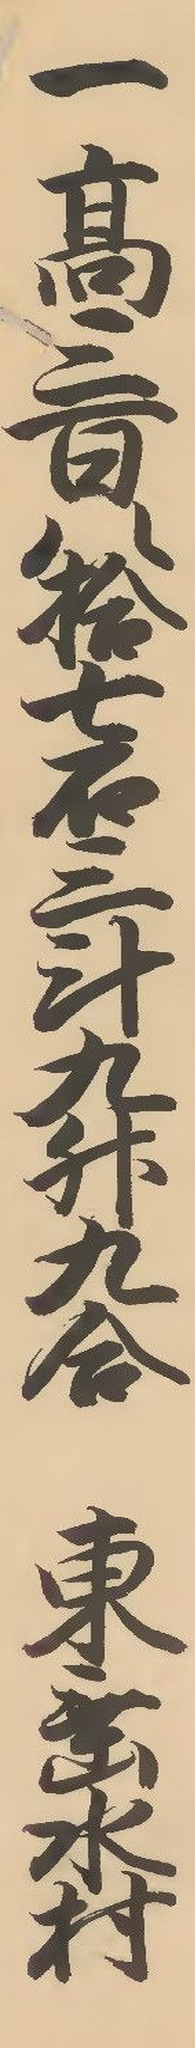一髙三百八拾七石三斗九升九合東垂水村
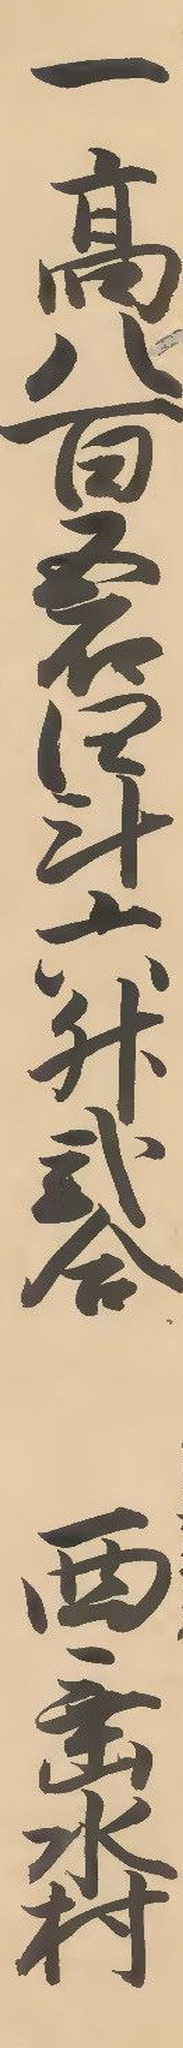一髙八百五石四斗六升弐合西垂水村
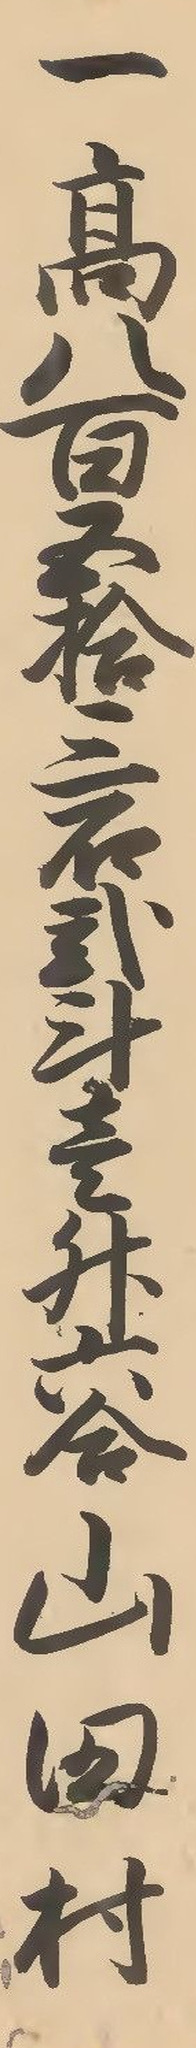一髙八百五拾三石弐斗壱升六合山田村
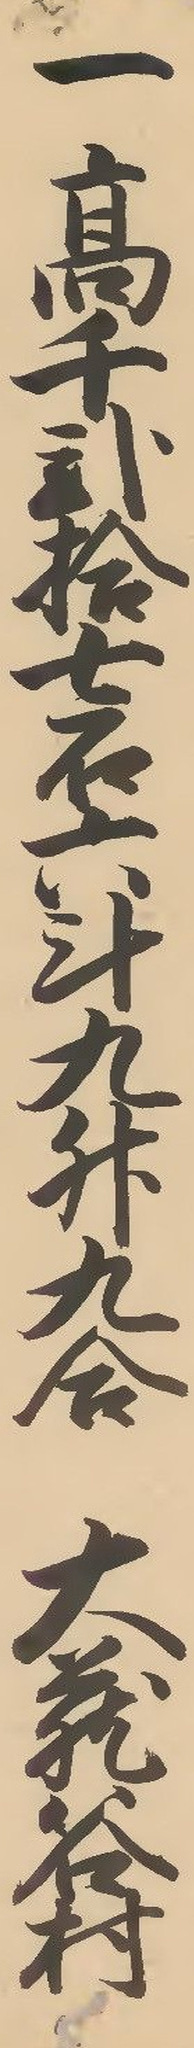一髙千弐拾七石六斗九升九合大藏谷村
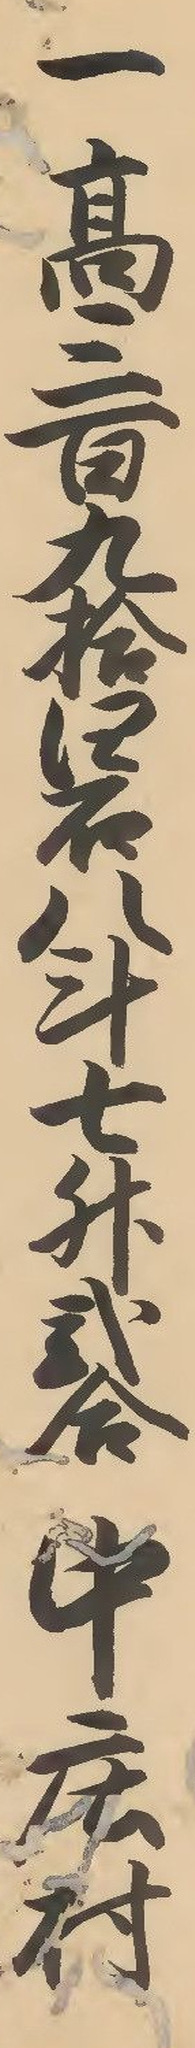一髙三百九拾四石八斗七升弐合中庄村

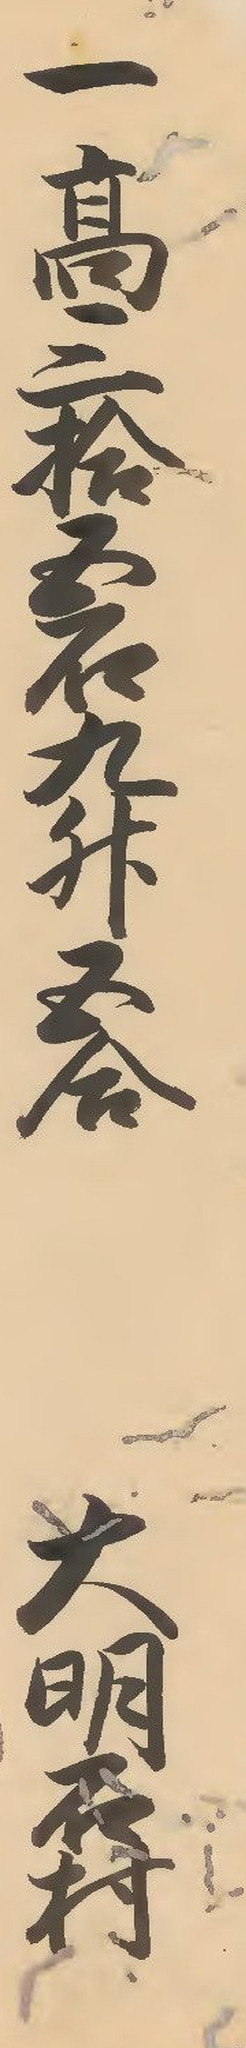一髙三拾五石九升五合大明石村
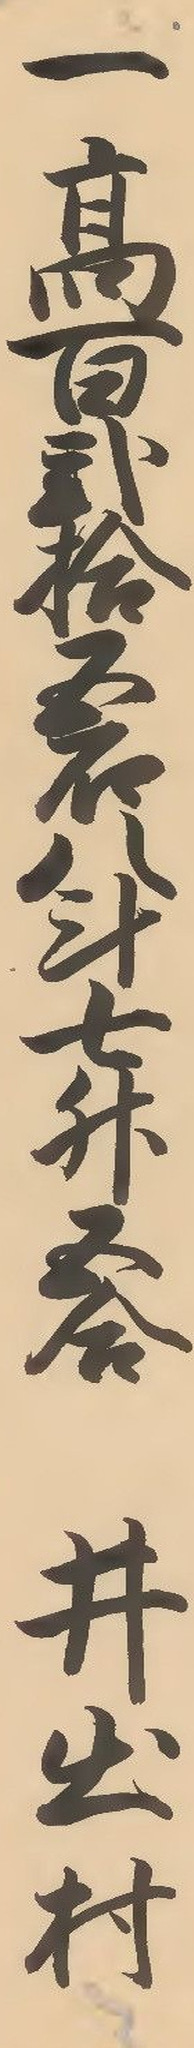一髙百弐拾五石八斗七升五合井出村
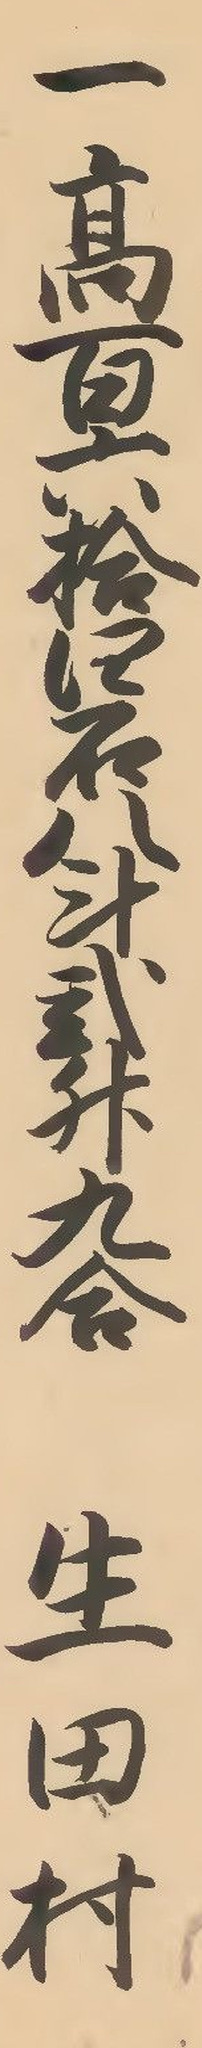一髙百六拾四石八斗弐升九合生田村
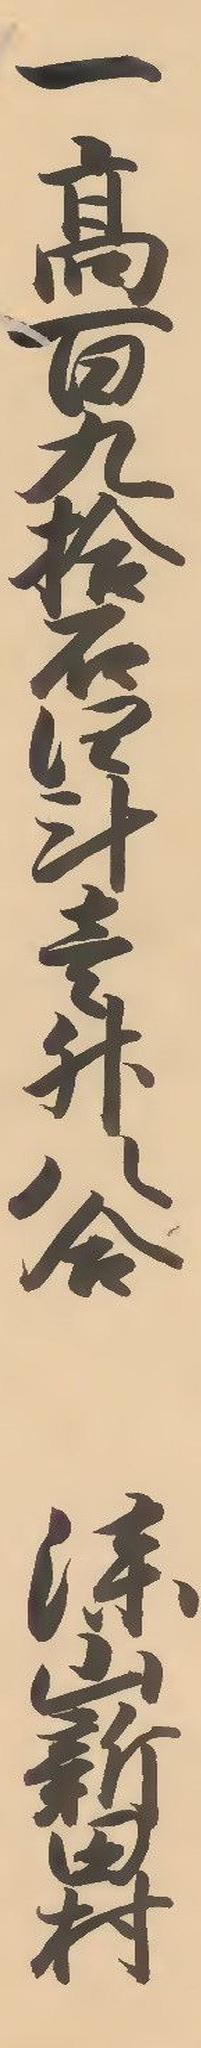一髙百九拾石四斗壱升八合漆山新田村
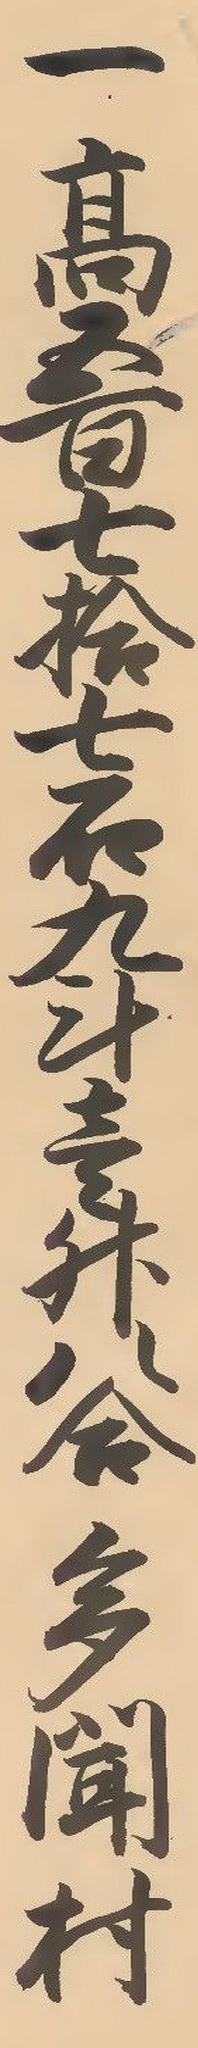一髙五百七拾七石九斗壱升八合多聞村
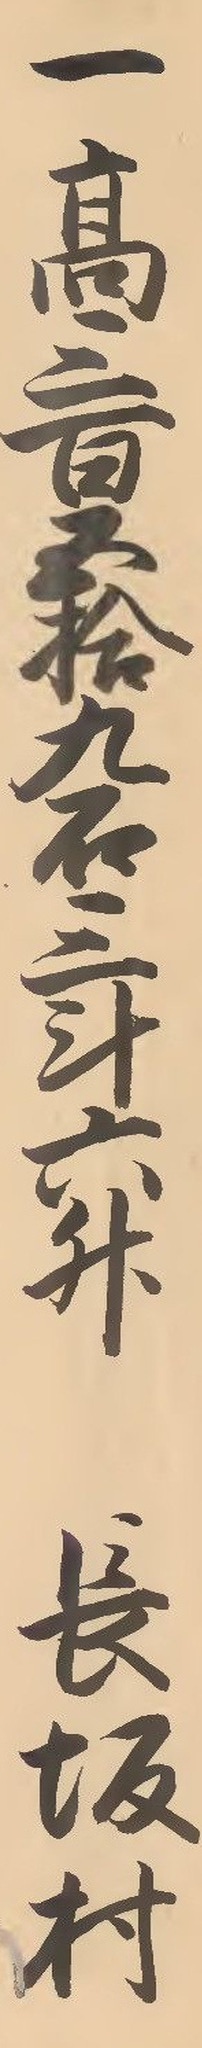一髙三百五拾九石三斗六升長坂村
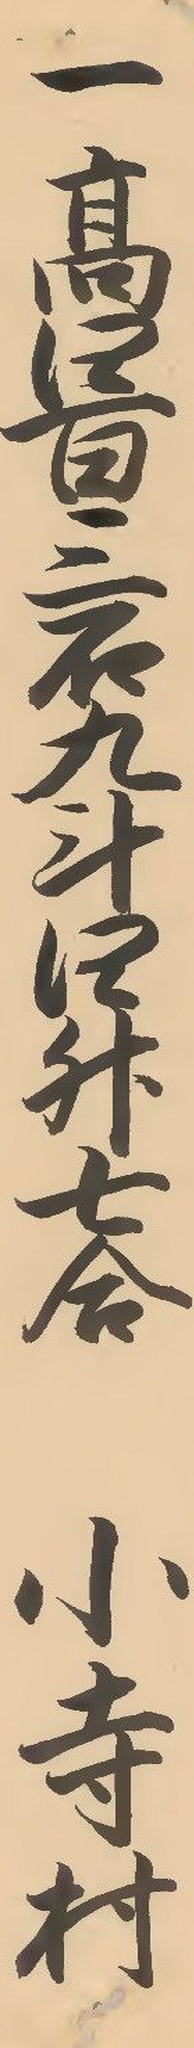一髙四百三石九斗四升七合小寺村
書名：播磨国郷帳
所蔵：国立公文書館 National Archives of Japan
